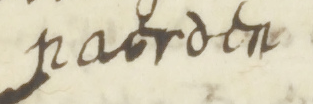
paerden
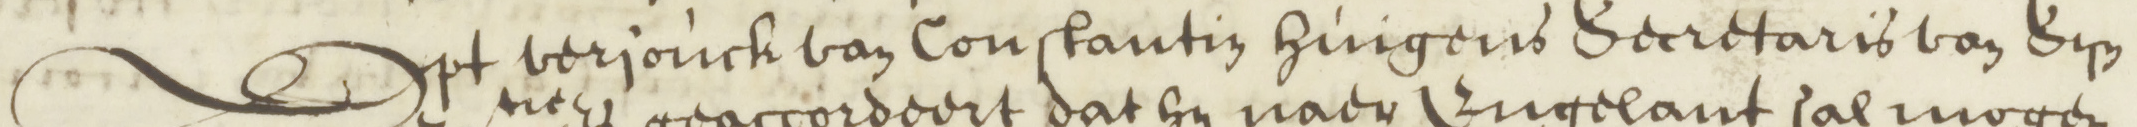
Opt versouck van Constantin Huigens Secretaris van Syn
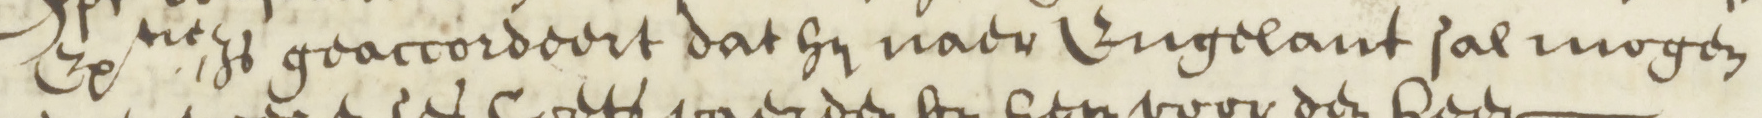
Extie, is geaccordeert dat hy naer Engelant sal mogen
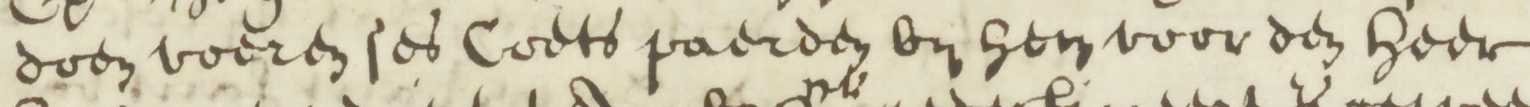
doen voeren ses Coets paerden by hem voor den heer
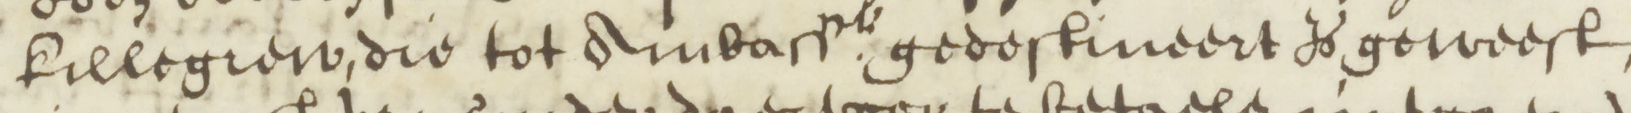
Killegrew die tot Ambassur. gedestineert is geweest,
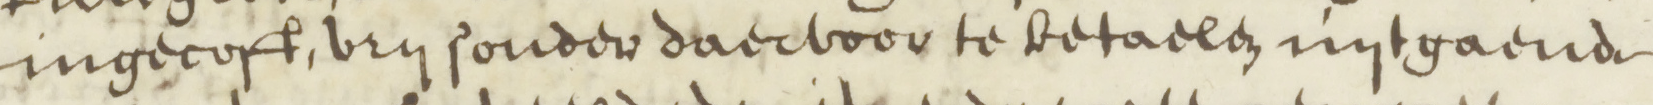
ingecoft, vry sonder daervoor te betaelen uytgaende
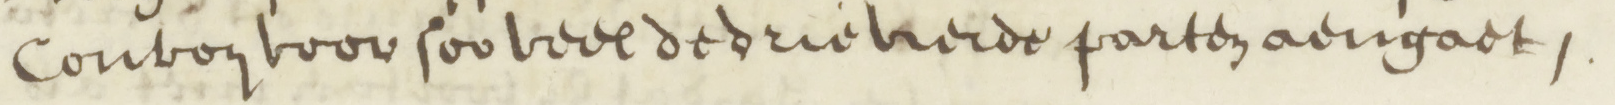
convoy voor soo veel de drie vierde parten aengaet.
